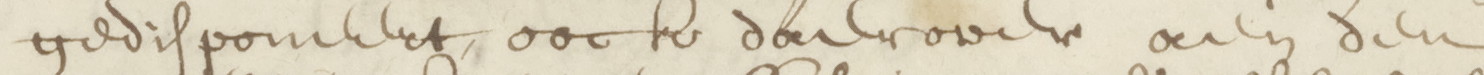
gedisponeert, oock daerover aen den
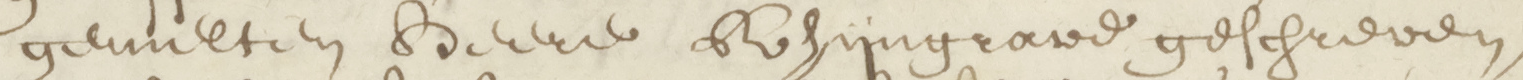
gemelten Heere Rhijngrave geschreven,
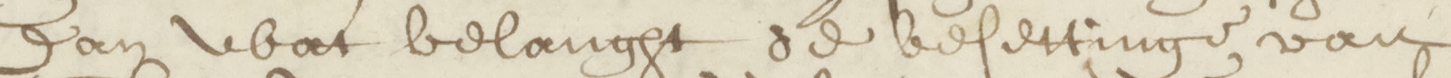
dan wat belanght de besettinge van
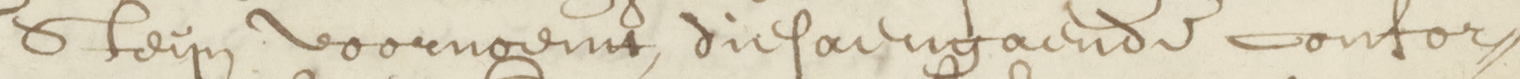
Steijn voornoemt, diesaengaende confor„
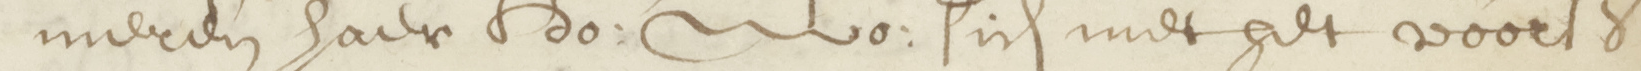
meren haer Ho:Mo: sich met het voors
